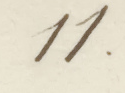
11.
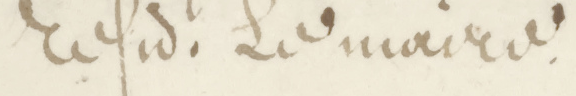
residt Le maire
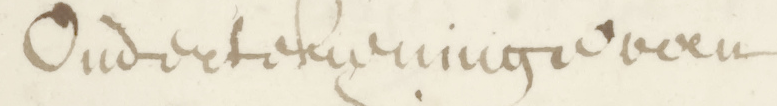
Ondertekeninge van
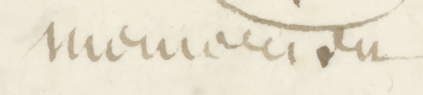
memorien
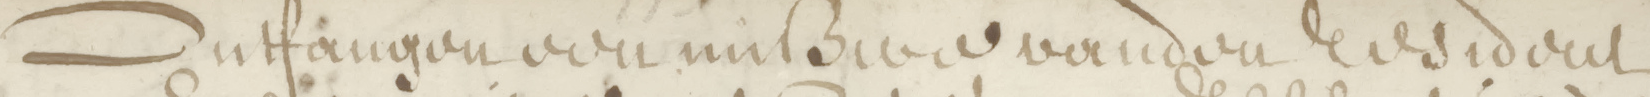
Ontfangen een missive vanden resident
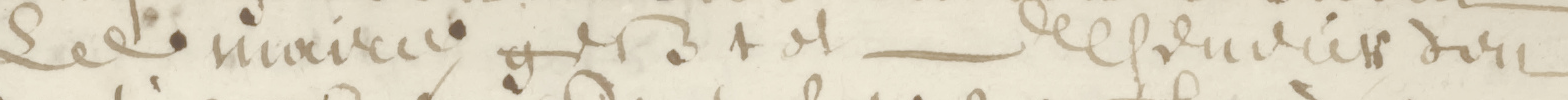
Le maire ges tot Elseneur den
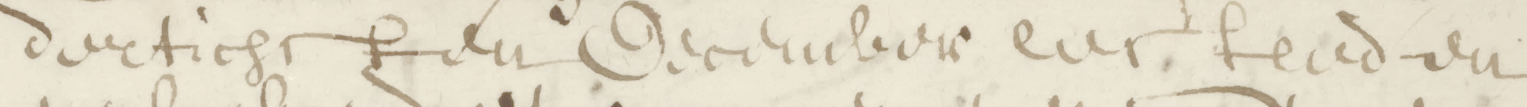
dertichsten December lestleden
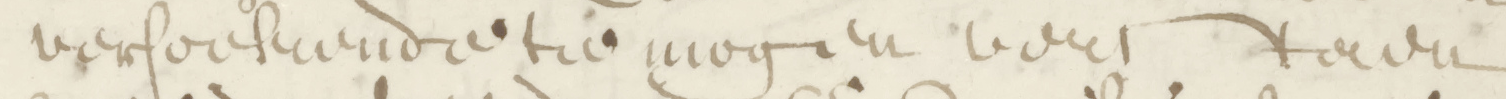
versoekende te mogen verstaen
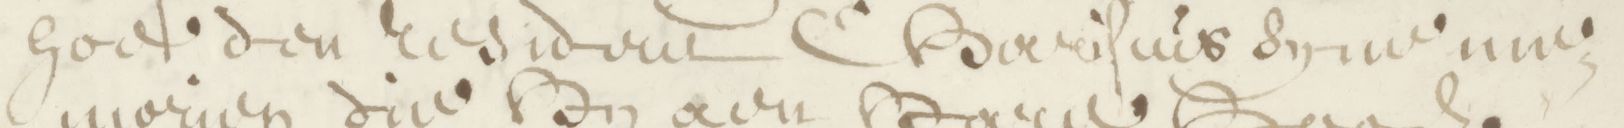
hoe den resident Charisius syne me„
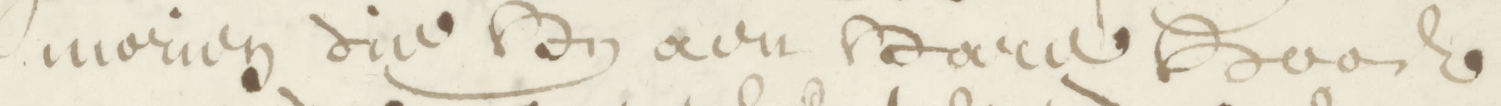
morien die hij aen hare Hooch
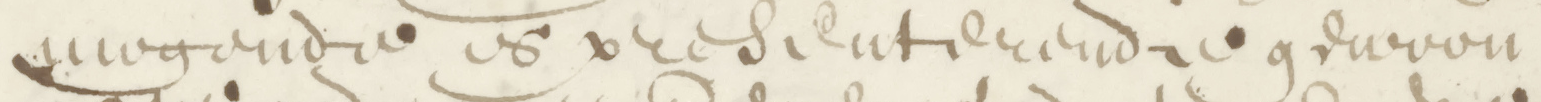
mogende is presenterende gewoon
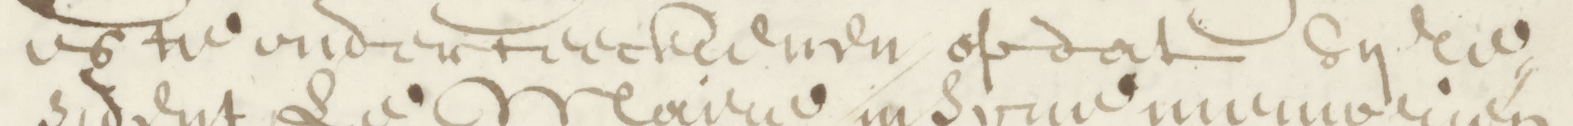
is te onderteeckenen opdat hy re,,
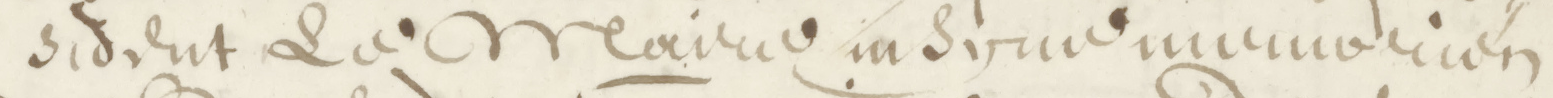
sident Le Maire in syne memorien
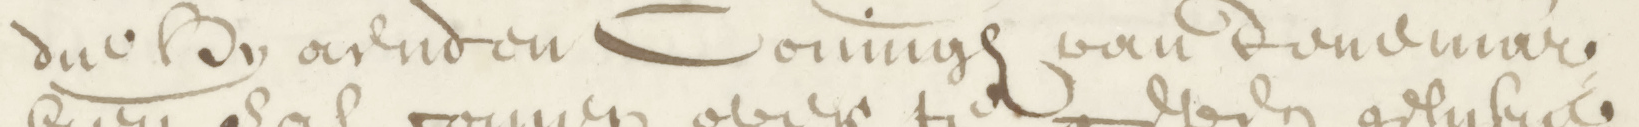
die hij aenden Coningh van Denemar„
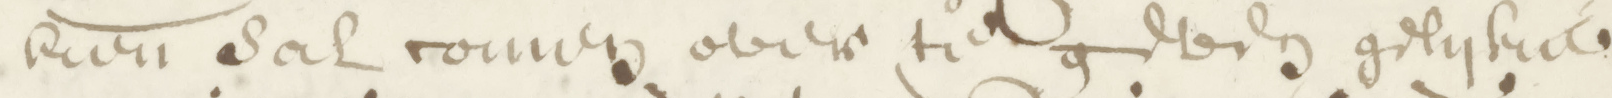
ken sal connen over te geven gelyke
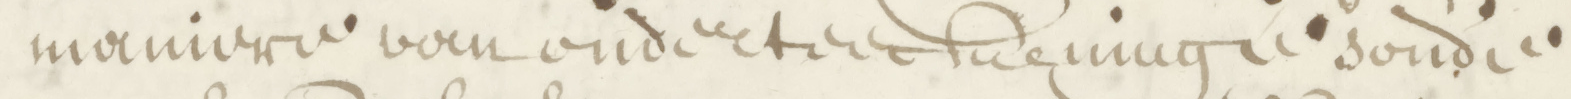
maniere van onderteeckeninge soude
